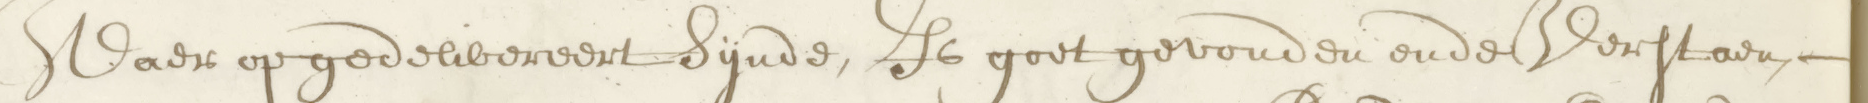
Waer op gedelibereert Sijnde, Is goetgevonden ende Verstaen,
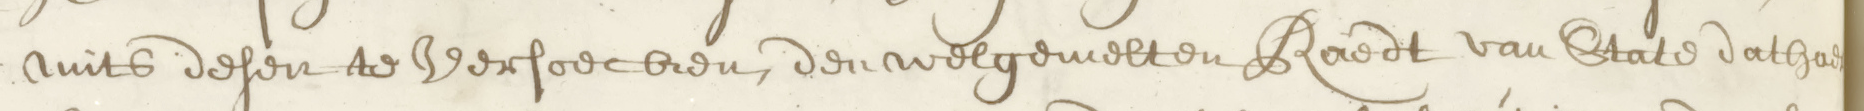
mits desen te versoecken den welgemelten Raedt van State dat haer
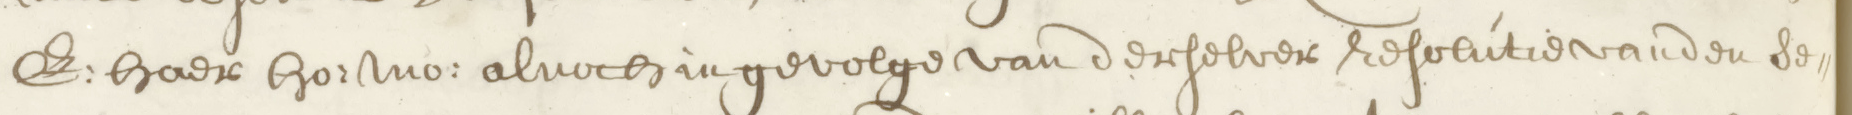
E: haer Ho:Mo: alnoch ingevolge van derselver resolutie vanden se„
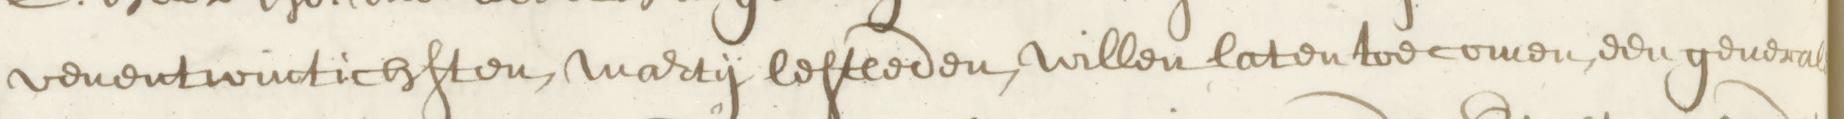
venentwintichsten martij lestleden willen laten toecomen een general
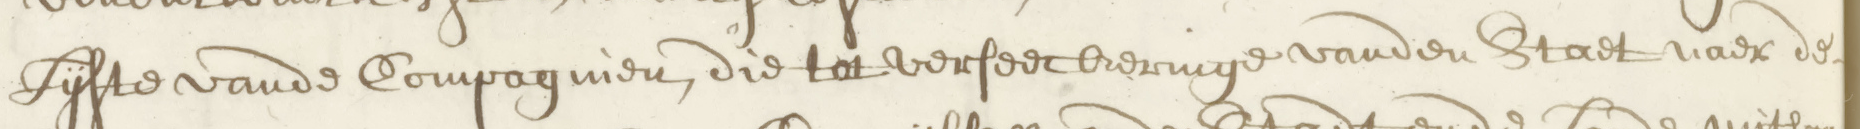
Lijste vande Compagnien, die tot verseeckeringe vanden Staet naer de
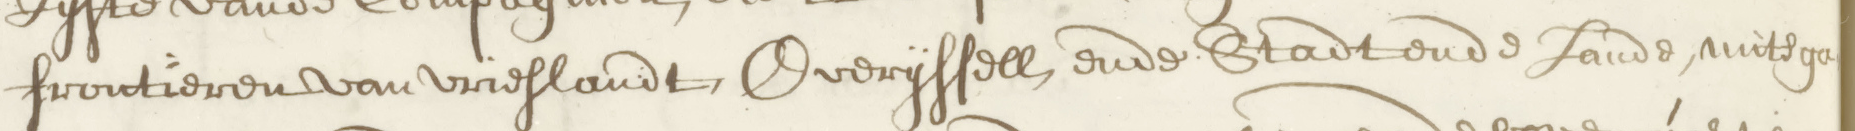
frontieren van vrieslandt, Overijssell, ende Stadt ende Lande, mitsga„
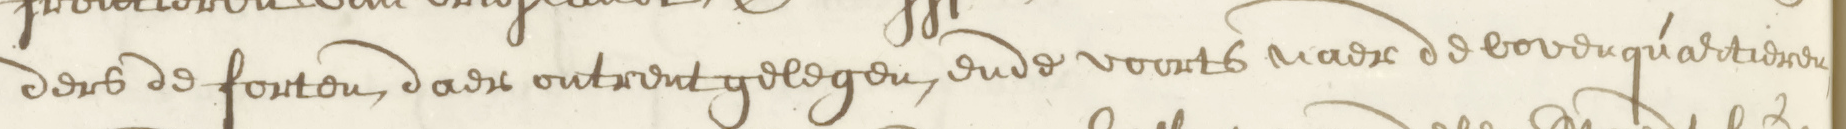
ders de forten daer ontrent gelegen ende voorts naer de bovenquartieren
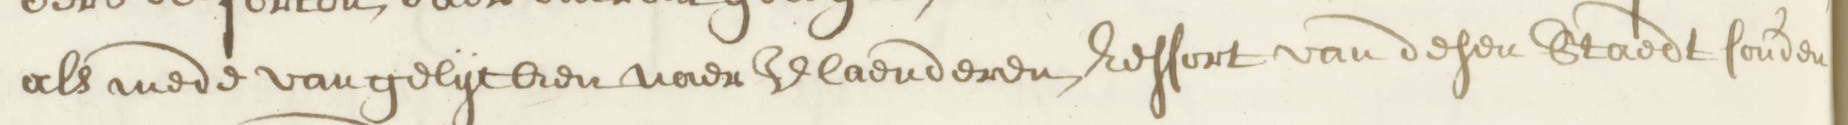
als mede van gelijcken naer Vlaenderen ressort van desen Staedt souden
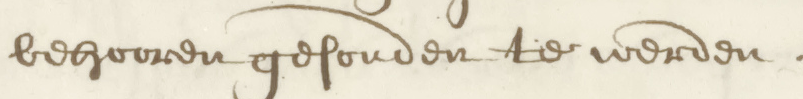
behooren gesonden te werden.
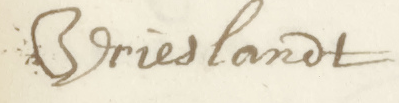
Vrieslandt
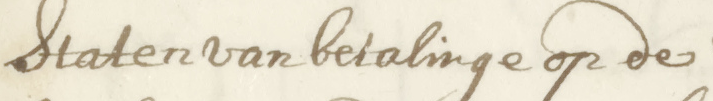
Staten van betalinge op de
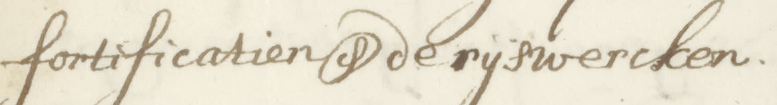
fortificatien & de rijswercken.
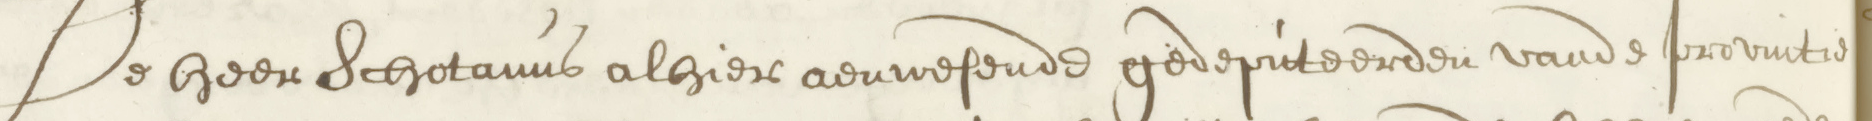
De heer Schotanus alhier aenwesende gedeputeerden vande provintie
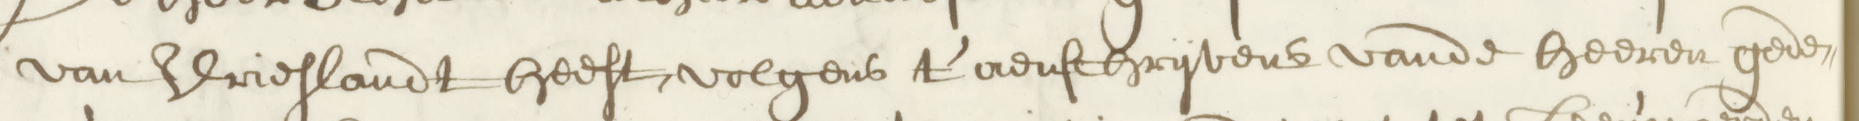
van Vrieslandt heeft, volgens t'aenschrijvens vande heeren gede„
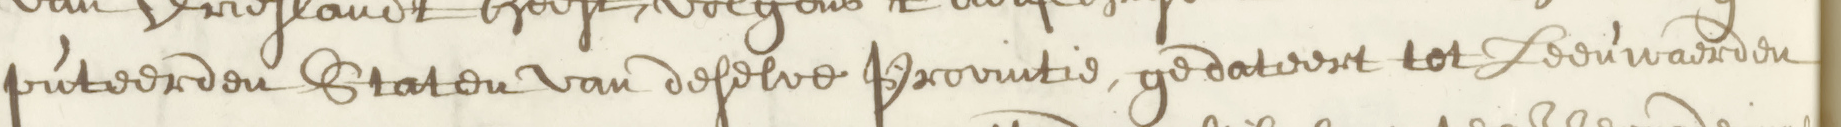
puteerden Staten van deselve Provintie, gedateert tot Leeuwaerden
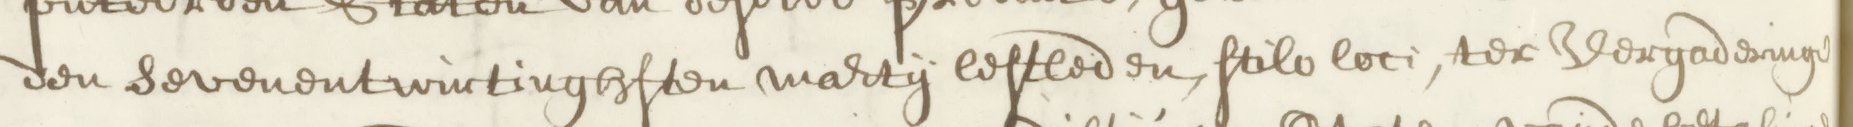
den sevenentwintinghsten martij lestleden stilo loci, ter Vergaderinge
